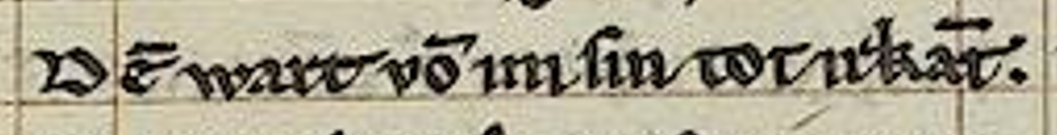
De(m) wart vo(n) im ſin tot irka(n)t.
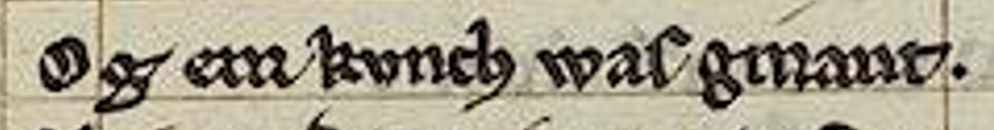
Og ein kvnch waſ ginant.
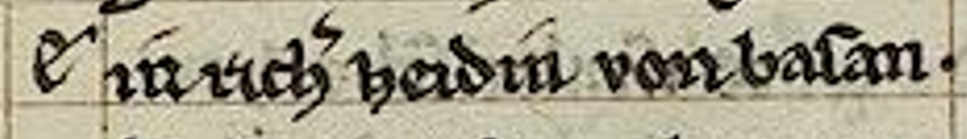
Ein rich(er) heidin von baſan.
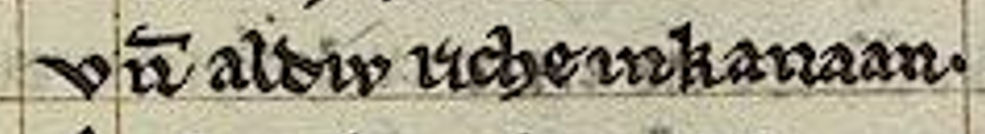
Vn(d) aldiv riche inkanaan.
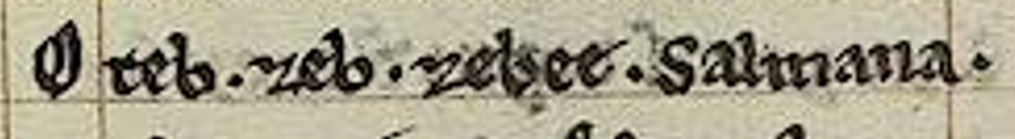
Oreb. zeb. zebee. salmana.
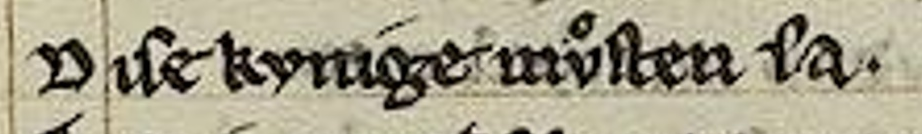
Diſe kvnige mv°oſten ſa.
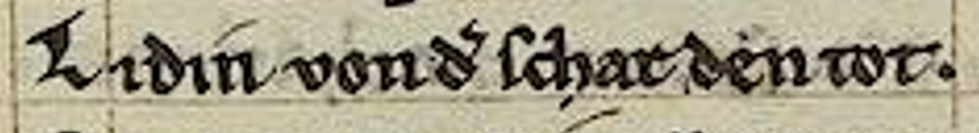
Lidin von d(er) ſchar den tot.
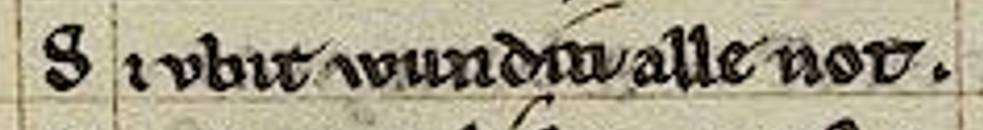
Si vbir wundin alle not.
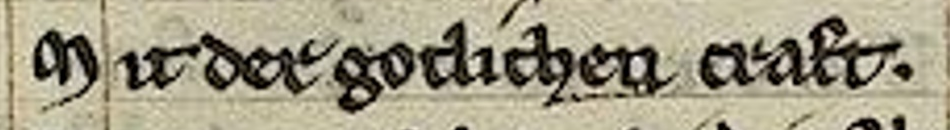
Mit der gotlichen craft.
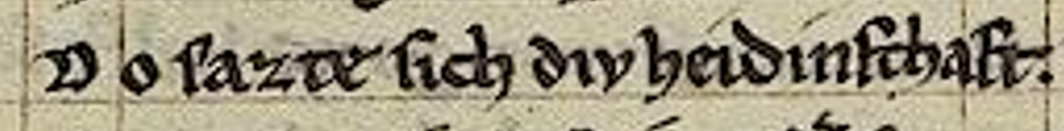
Do ſazte ſich div heidinſchaft.
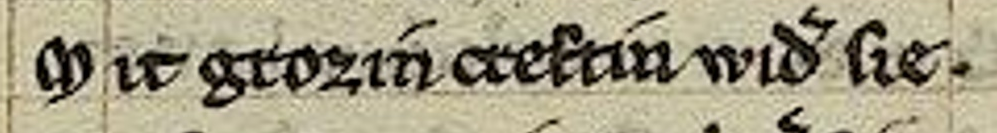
Mit grozin creftin wid(er) ſie.
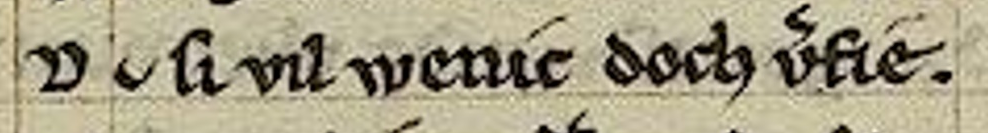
D(az) ſi vil wenic doch v(er)fie.
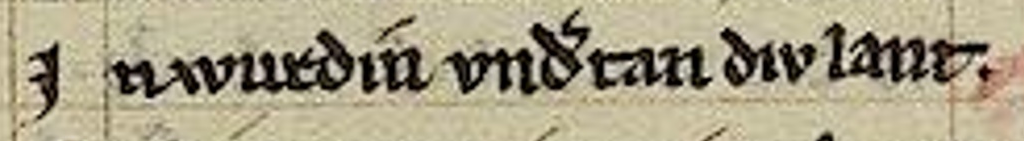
Inwurdin vnd(er)tan div lant.
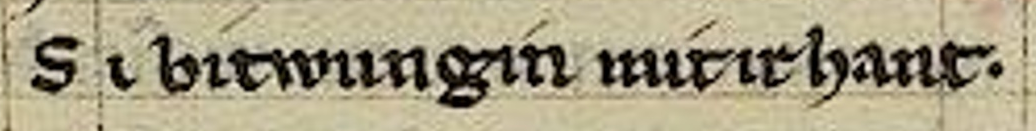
Si bitwungin mit ir hant.
